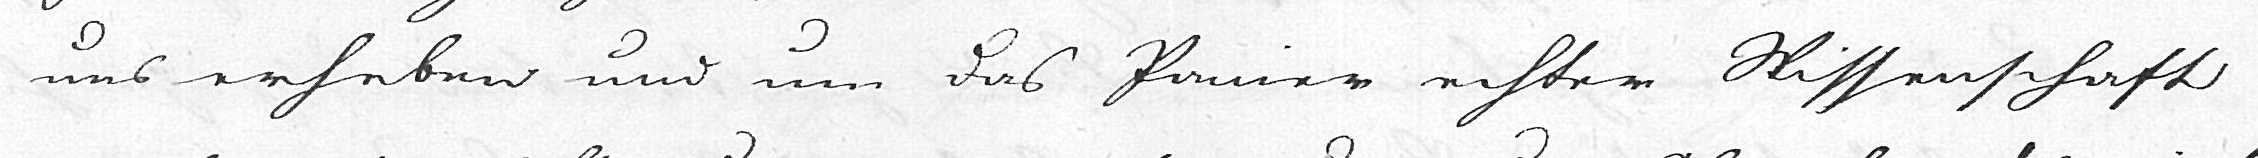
uns erheben und um das Panier echter Wissenschaft
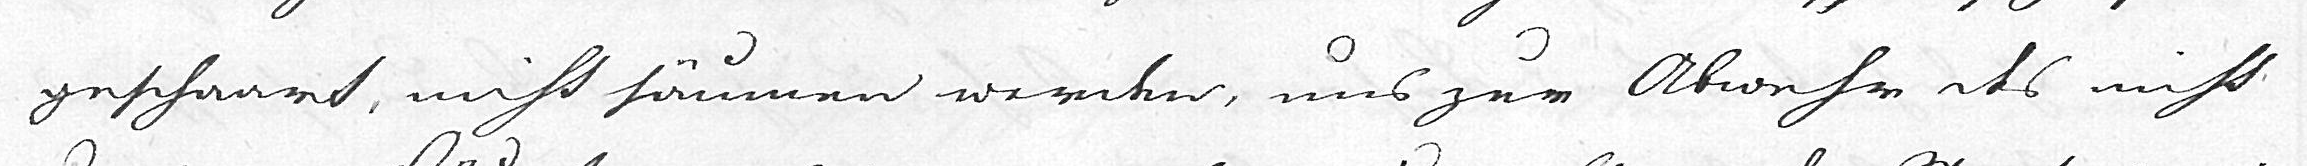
geschaart, nicht säumen werden, uns zur Abwehr des nicht
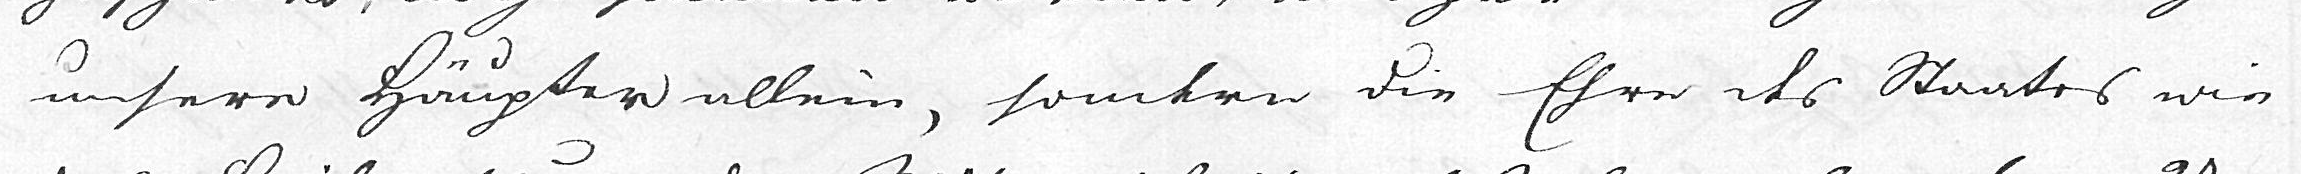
unsere Häupter allein, sondern die Ehre des Staates wie
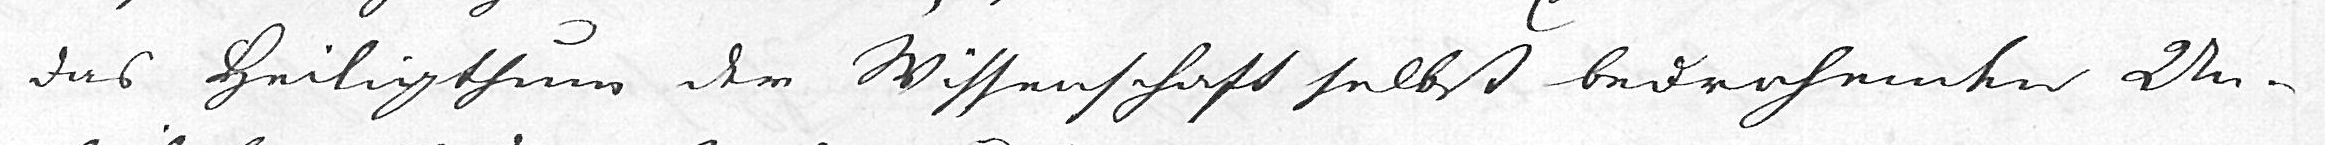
das Heiligthum der Wissenschaft selbst bedrohenden Un-
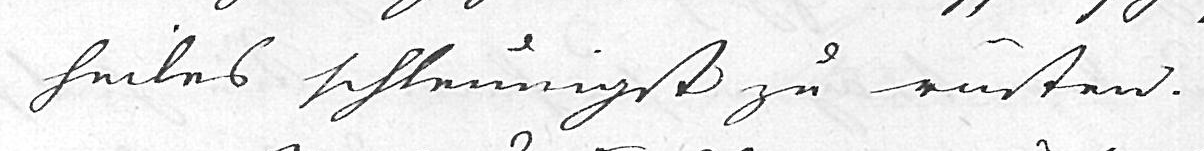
heiles schleunigst zu rüsten.
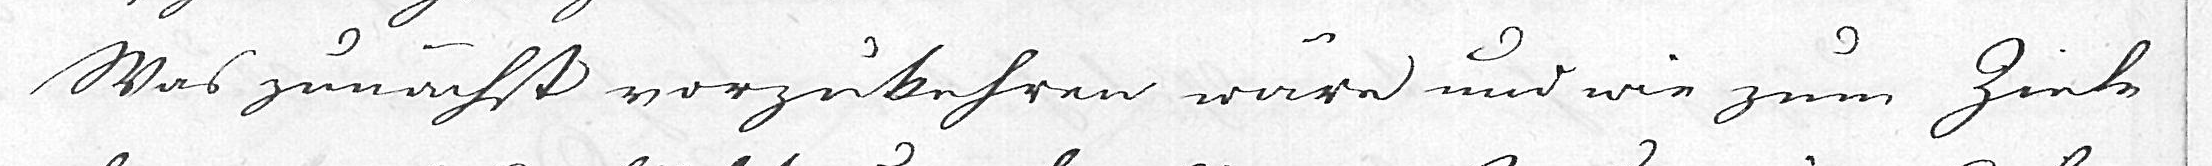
Was zunächst vorzukehren wäre und wie zum Ziele
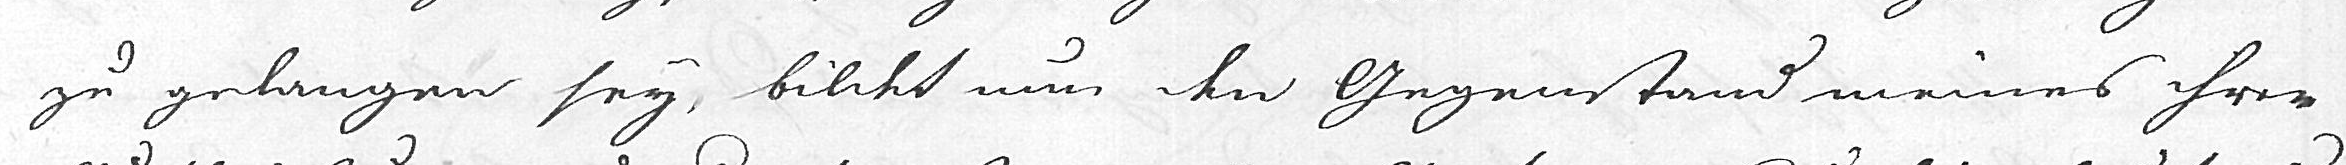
zu gelangen sey, bildet nun den Gegenstand meines ihrer
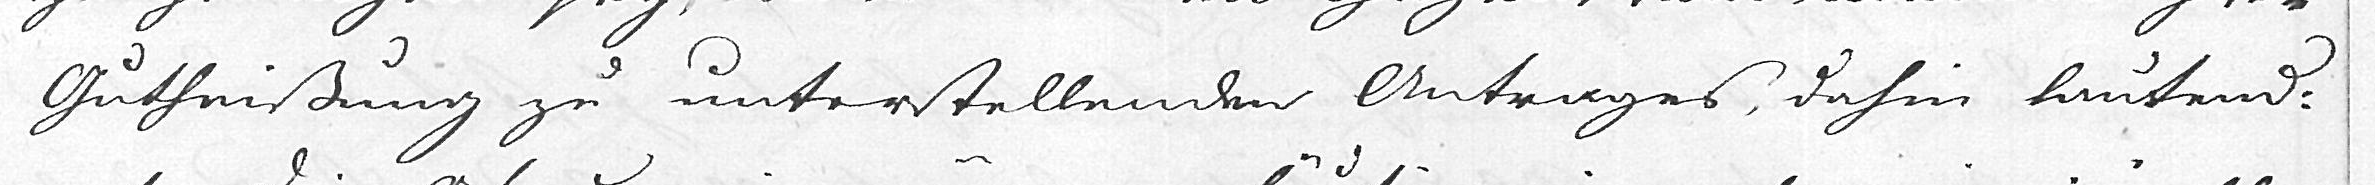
Gutheißung zu unterstellenden Antrages, dahin laufend:
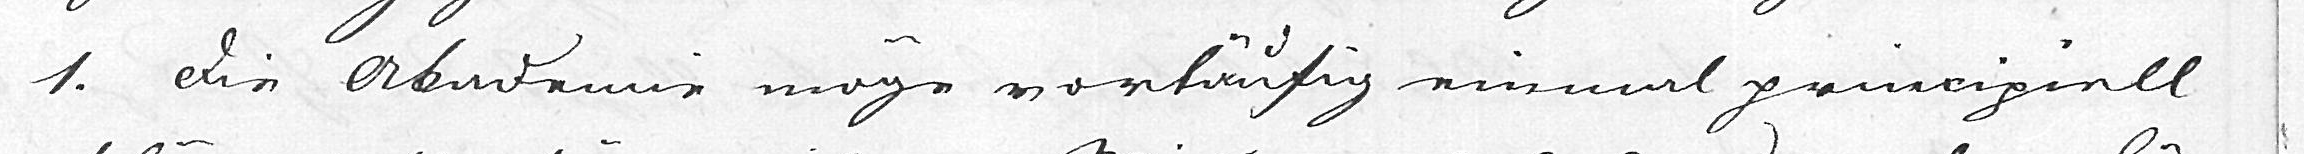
1. Die Akademie möge vorläufig einmal principiell
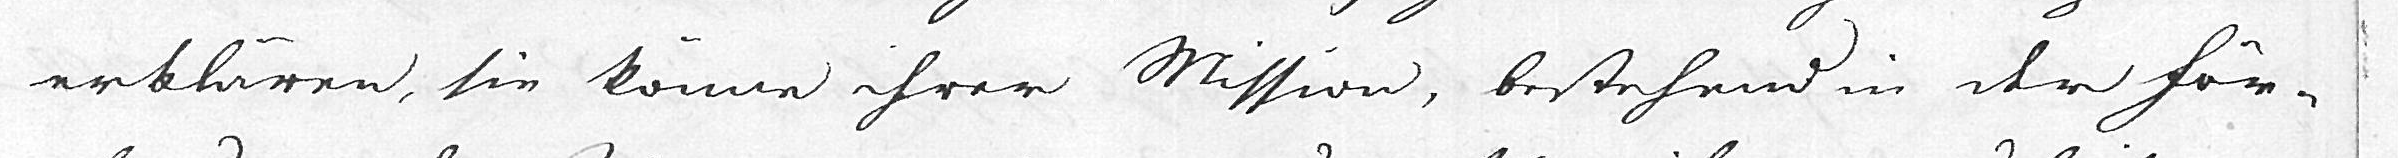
erklären, die könne ihrer Mission, bestehend in der För-
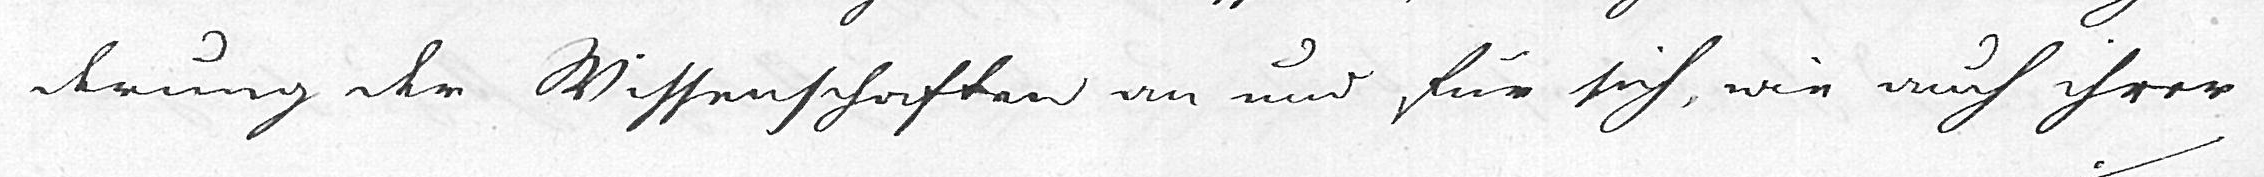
derung der Wissenschaften an und für sich, wie auch ihrer
